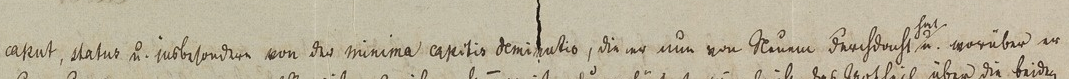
caput, status u. insbesondere von der minima capitis deminutio, die er nun von Neuem durchdacht hat u. worüber er
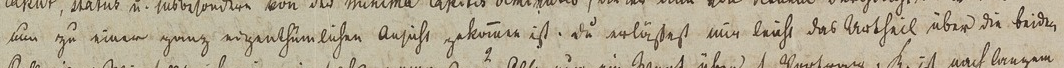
nun zu einer ganz eigenthümlichen Ansicht gekommen ist. Du erlässest mir leicht das Urtheil über die beiden
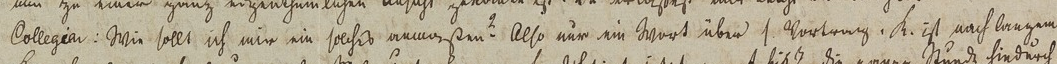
Collegien: Wie sollt ich mir ein solches anmaßen? Also nur ein Wort über s. Vortrag. R. ist nach langem
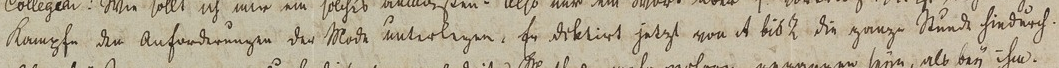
Kampfe den Anforderungen der Mode unterlegen. Er diktirt jetzt von A bis Z die ganze Stunde hindurch.
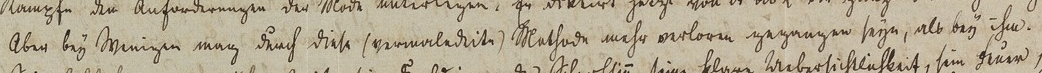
Aber bey Wenigen mag durch diese (vermaledeite) Methode mehr verloren gegangen seyn, als bey ihm.
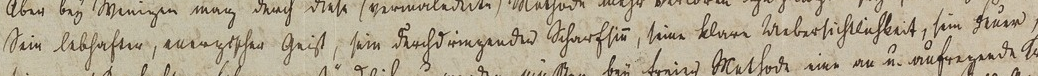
Sein lebhafter, energischer Geist, sein durchdringender Scharfsinn, seine klare Uebersichtlichkeit, sein Feuer,
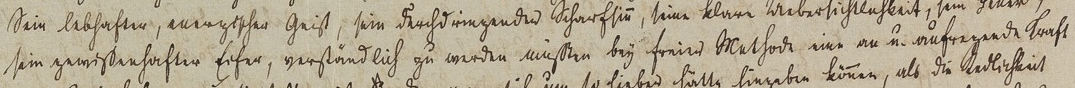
sein gewissenhafter Eifer, verständlich zu werden müßten bey freier Methode eine an u. aufregende Kraft
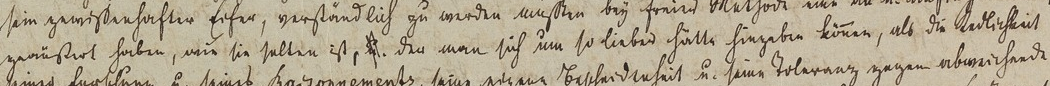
geäußert haben, wie sie selten ist, u. der man sich um so lieber hätte hingeben können, als die Redlichkeit
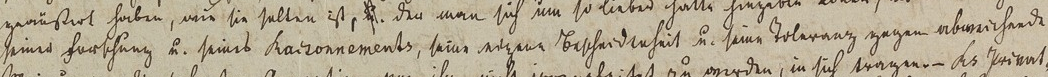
seiner Forschung u. seines Raisonnements, seine eigene Bescheidenheit u. seine Toleranz gegen abweichende
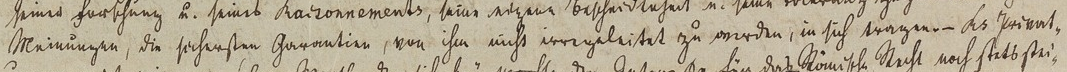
Meinungen, die sichersten Garantien, von ihm nicht irregeleitet zu werden, in sich tragen. – Rs Privat-
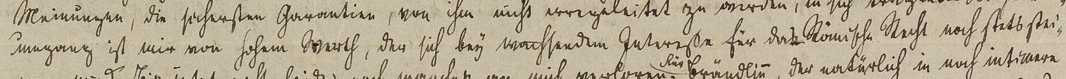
umgang ist mir von hohem Werth, der sich bey wachsendem Interesse für das Römische Recht noch stets stei-
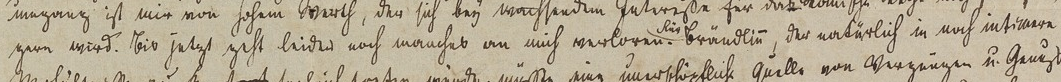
gern wird. Bis jetzt geht leider noch manches an mich verloren. FürBrändlinn, der natürlich in noch intimere
